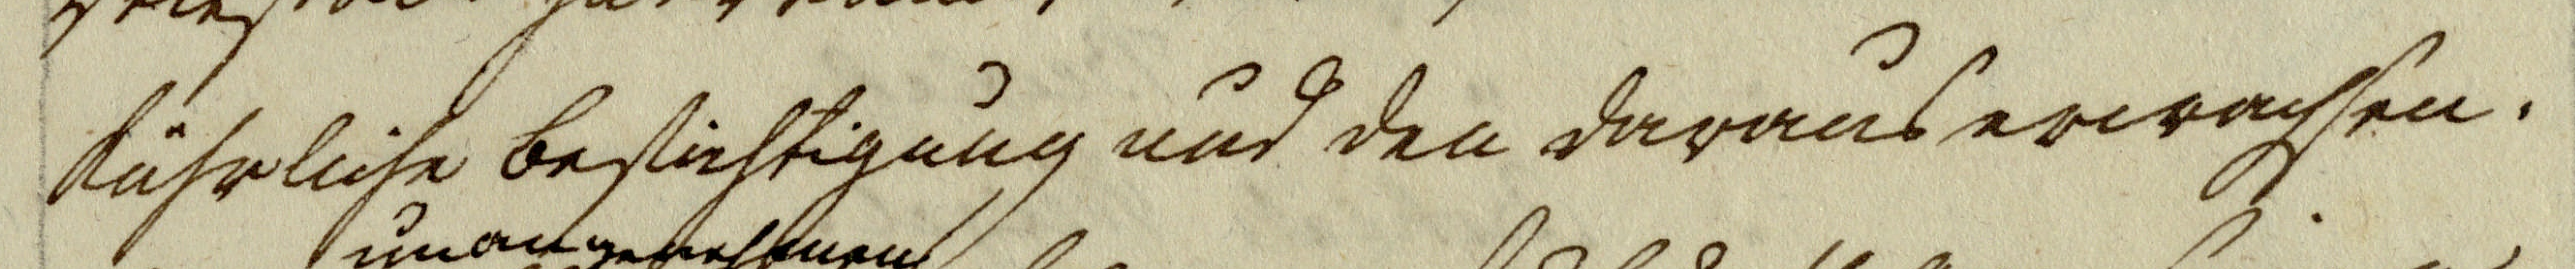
kührliche Besichtigung und den daraus erwachsen¬
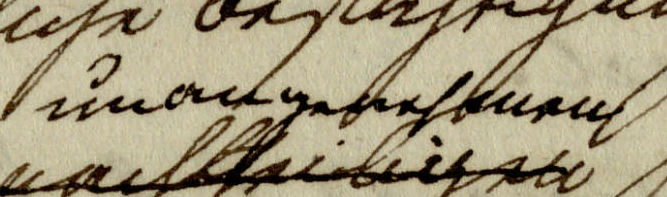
unangenehmen
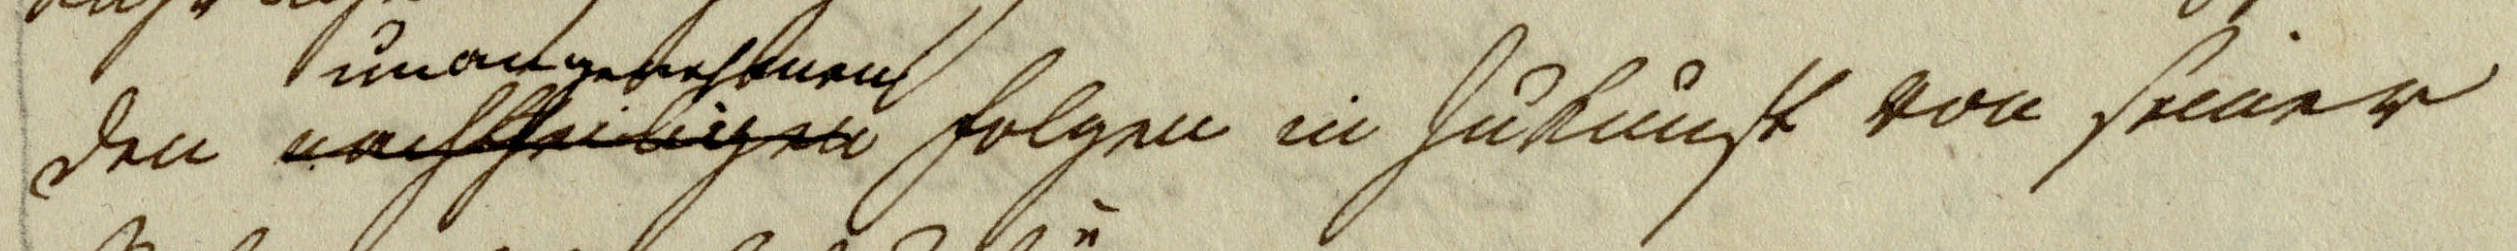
den nachtheiligen Folgen in Zukunft von seiner
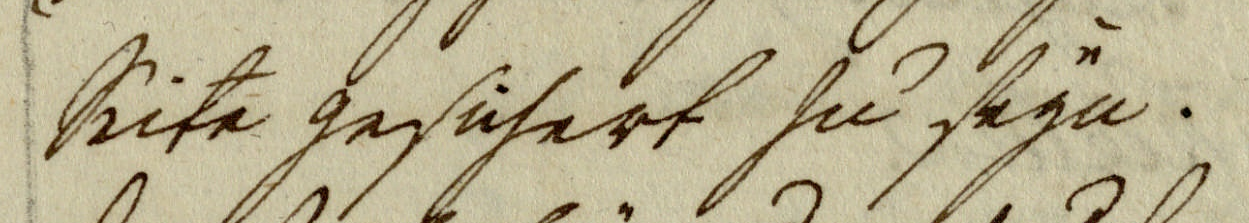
Seite gesichert zu seÿn.
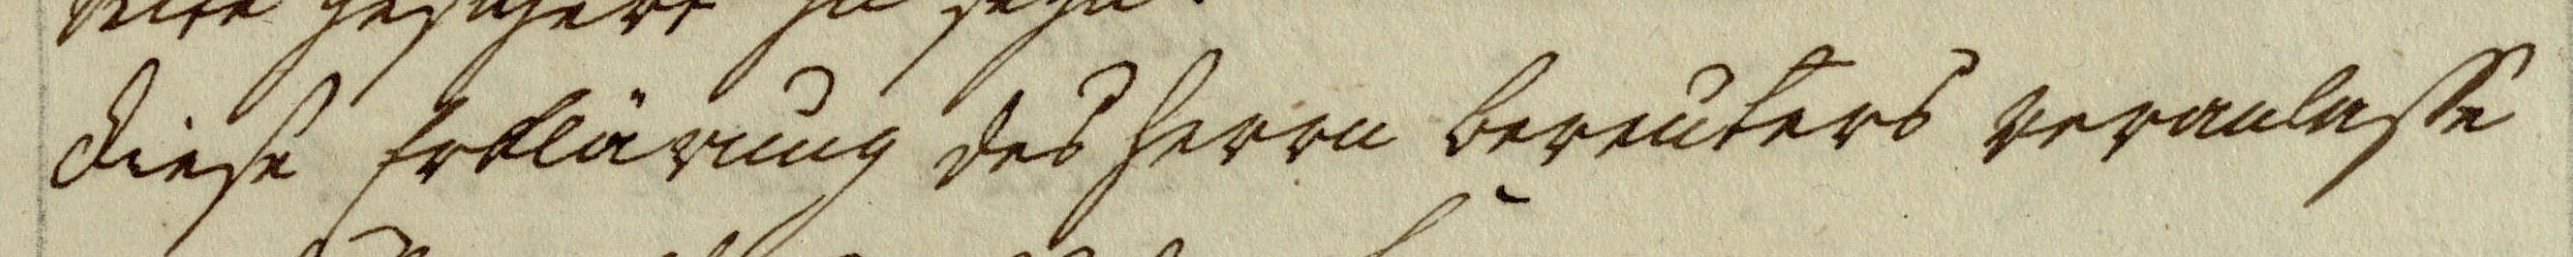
Diese Erklärung des Herrn Bereuters veranlasse
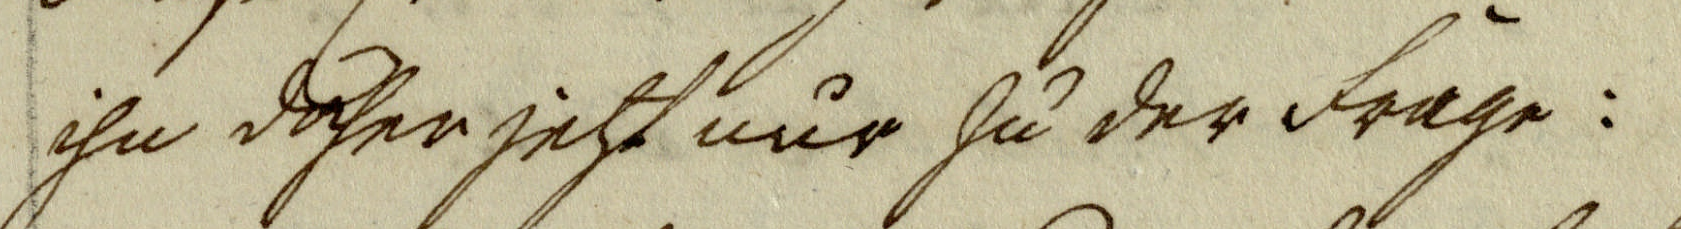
ihn daher jetzt nur zu der Frage:
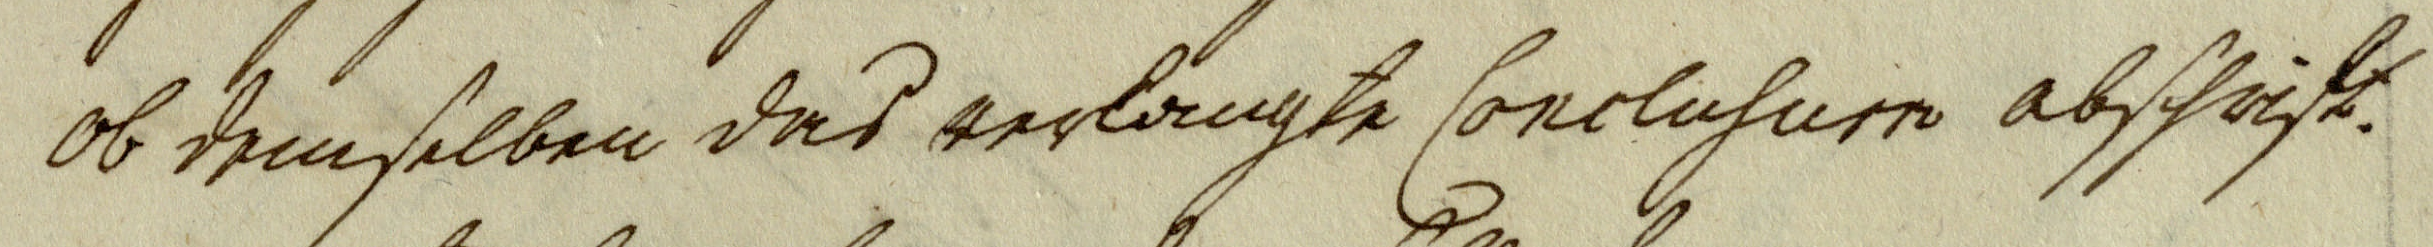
ob demselben das verlangte Conclusum abschrift¬
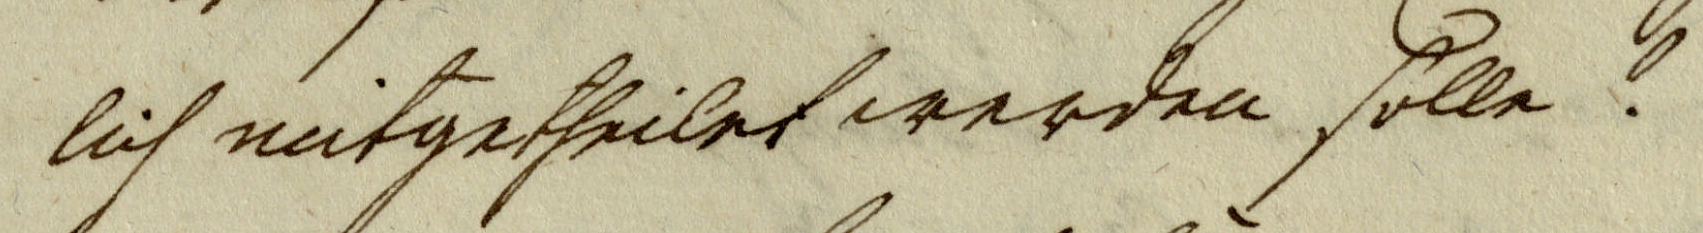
lich mitgetheilet werden solle?
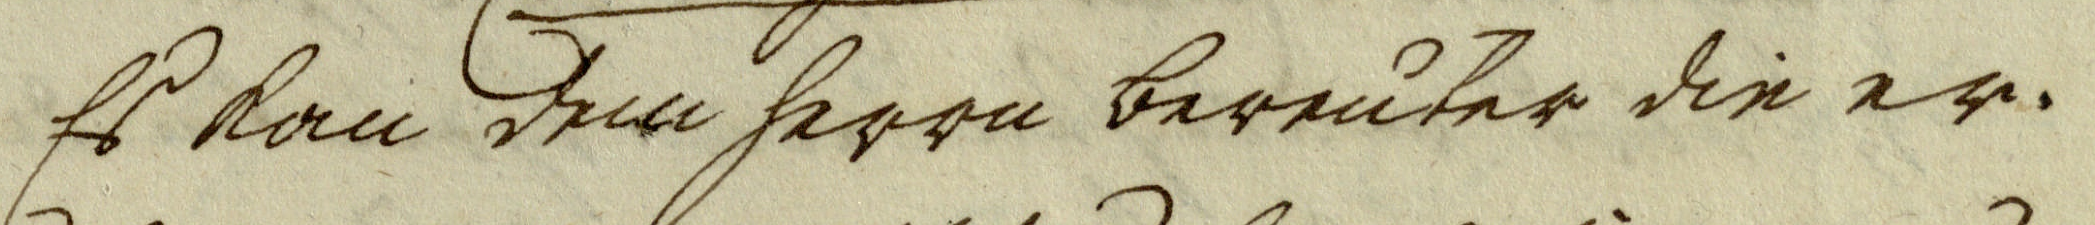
Es kan dem Herrn Bereuter die er¬
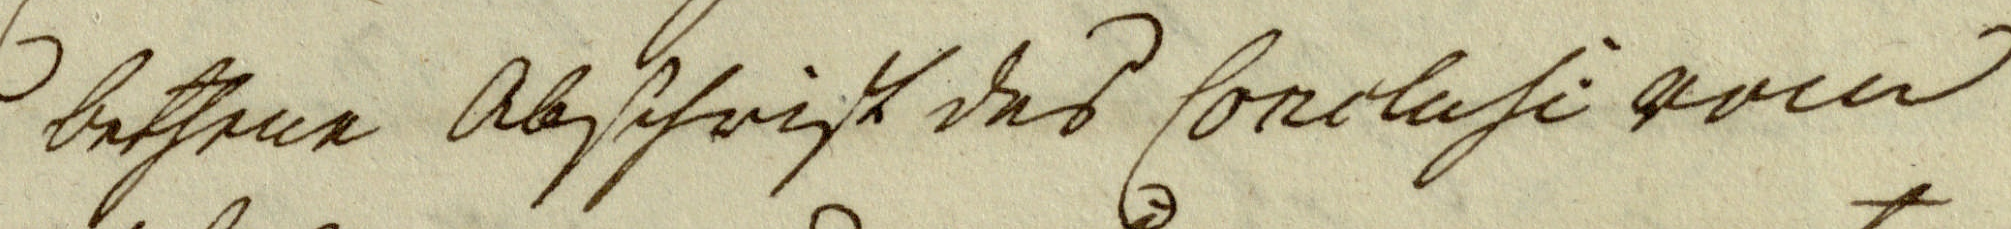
bethene Abschrift des Conclusi vom
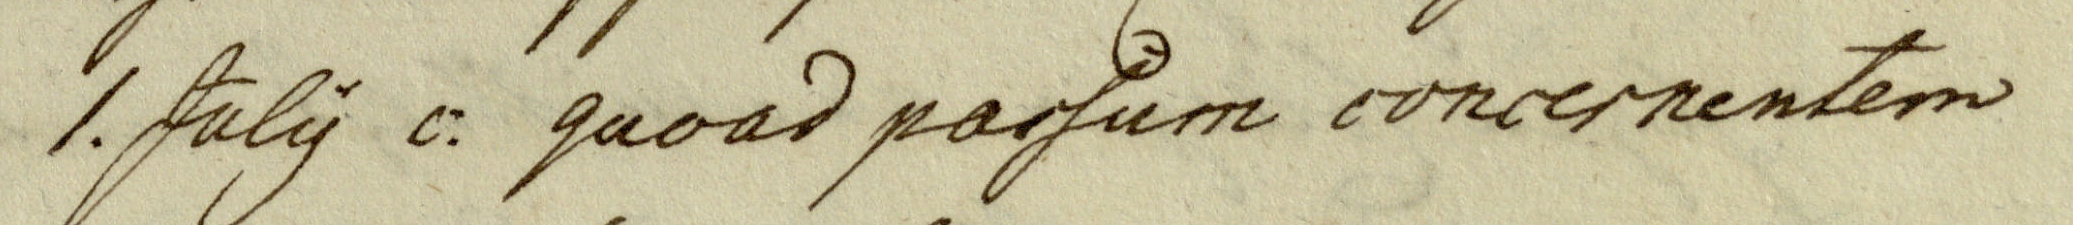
1. Julÿ c: quoad passum concernentem
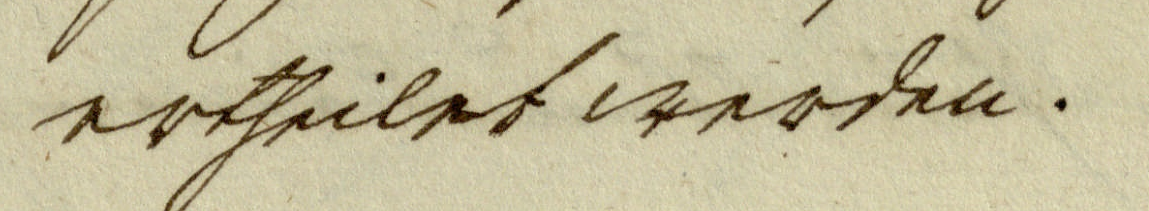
ertheilet werden.
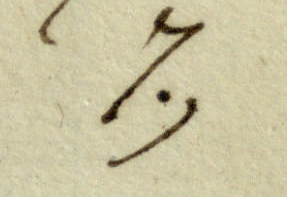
7.,
